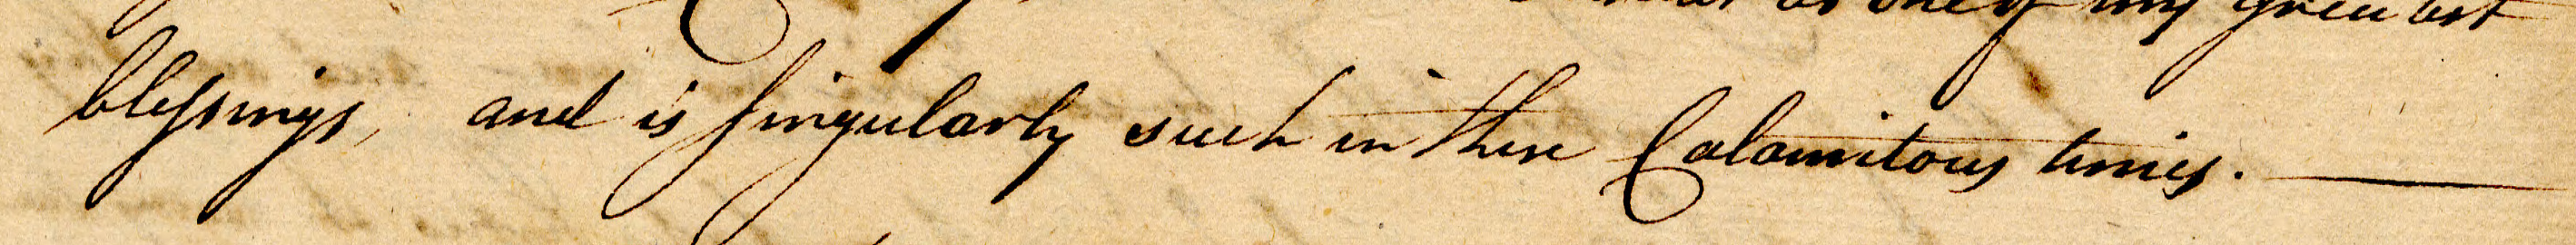blessings, and is singularly such in these Calamitous times.-
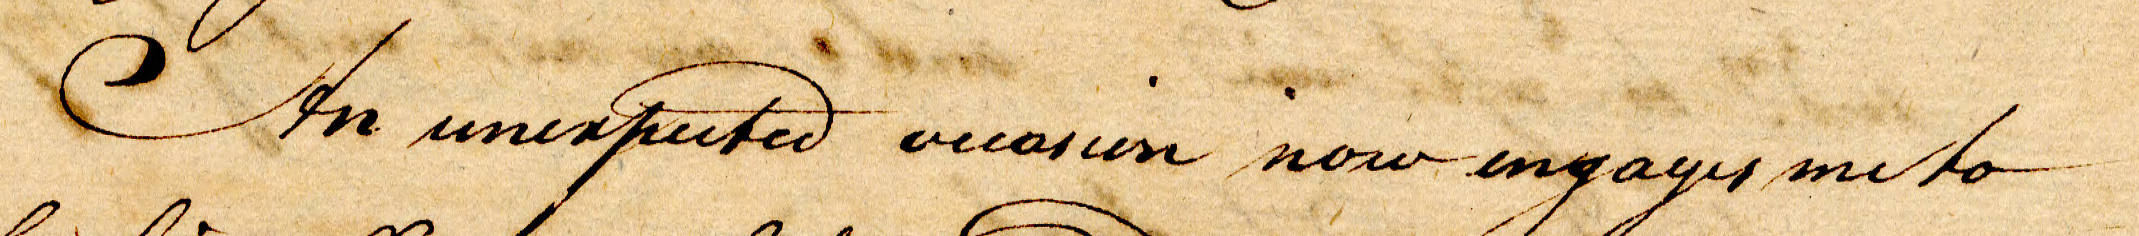An unexpected occasion now engages me to
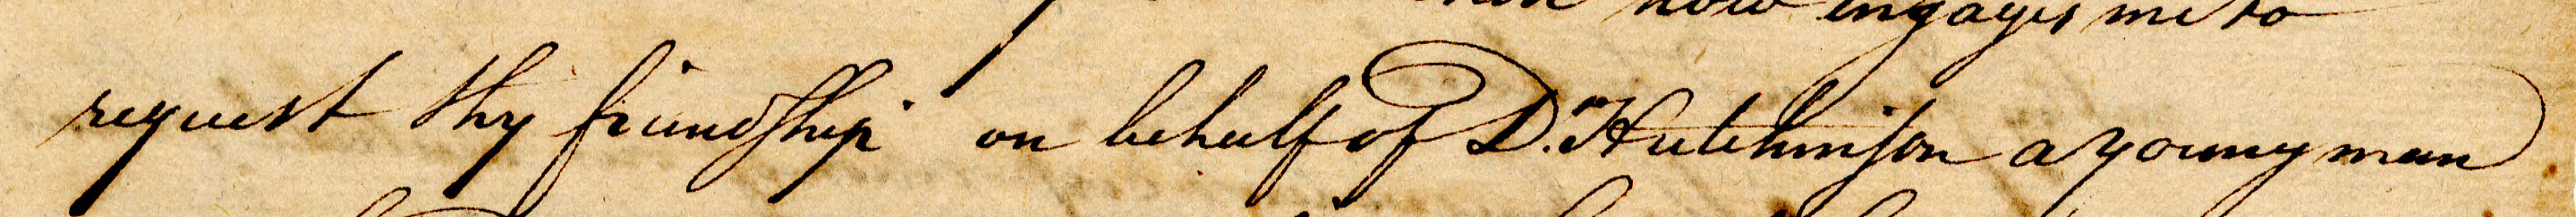request thy friendship on behalf of D^r. Hutchinson a young man
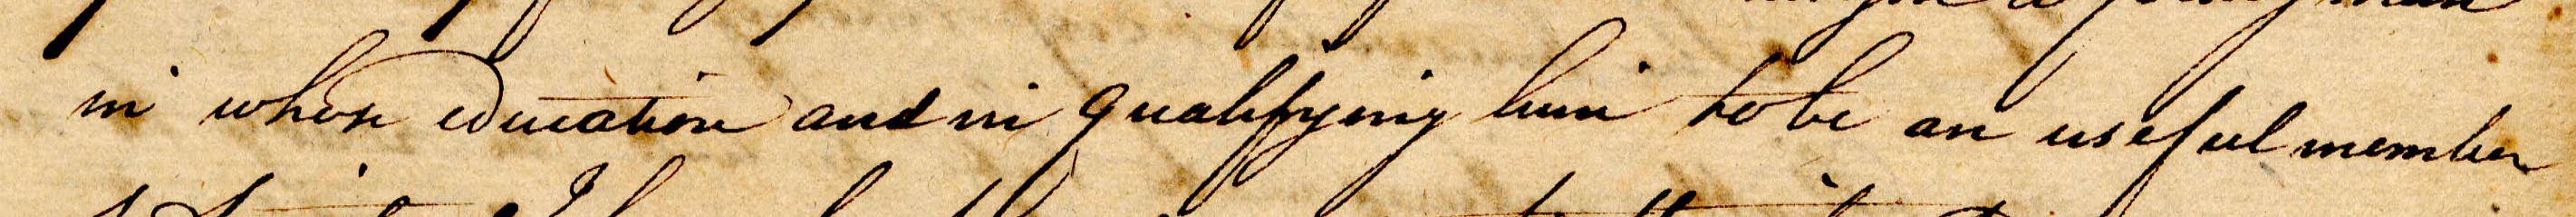in whose education and in qualifying him to be an useful member
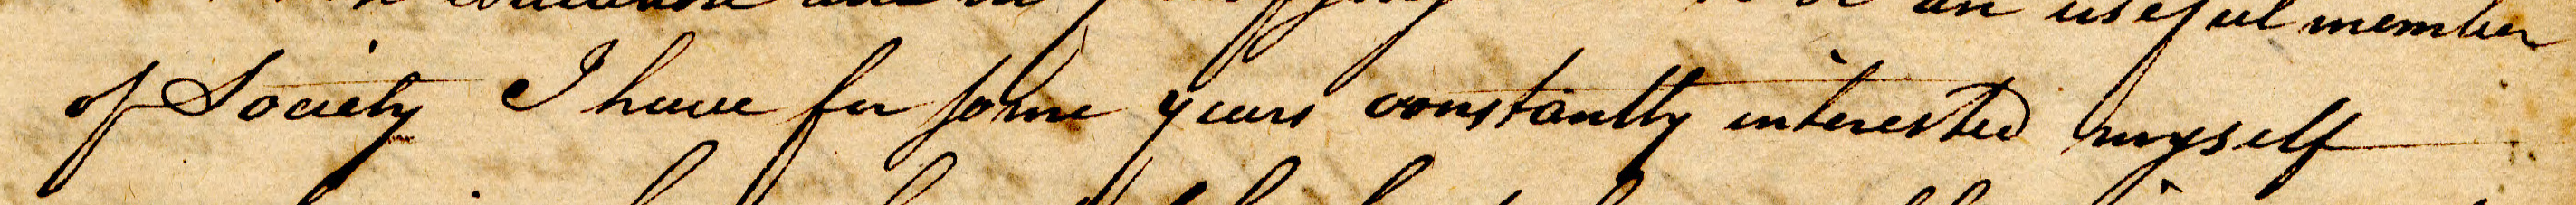of Society I have for some years constantly interested myself
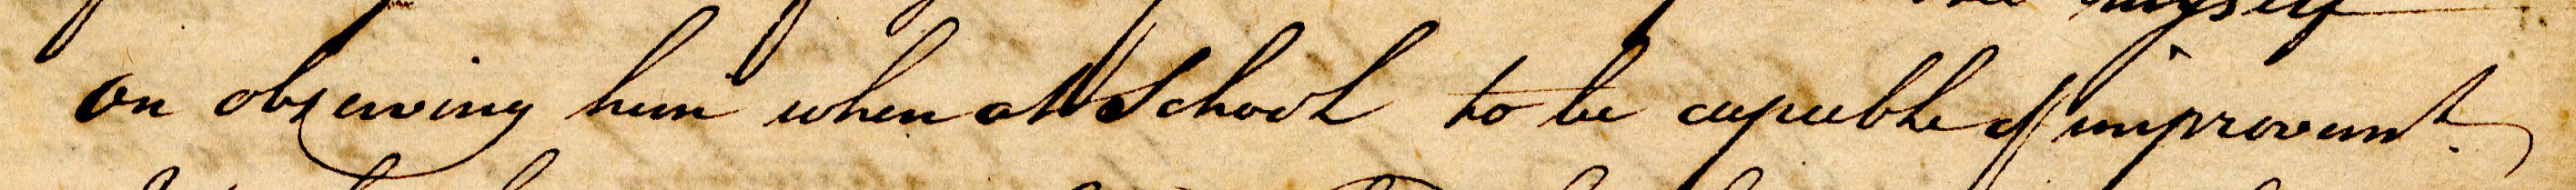on observing him when at School to be capable of improvem^t.
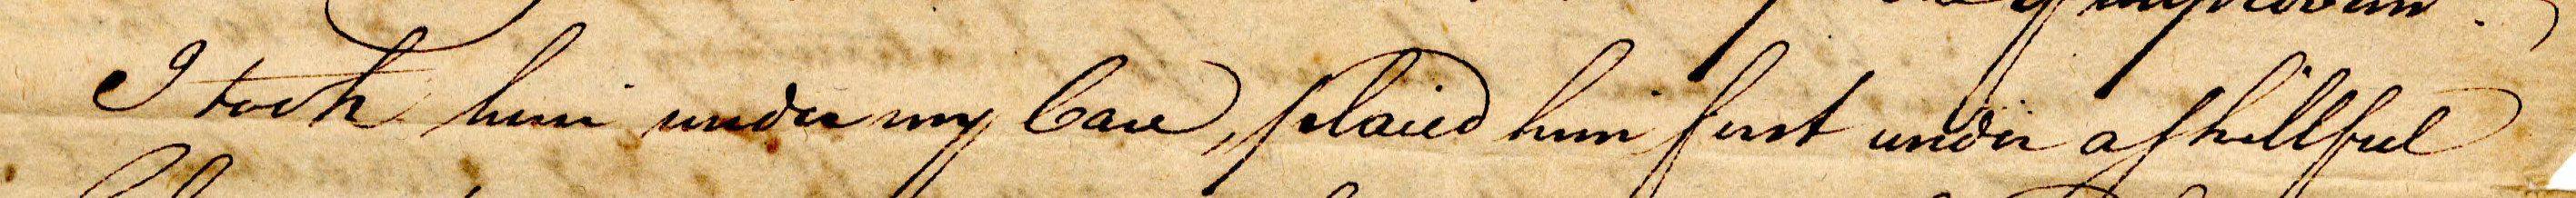I took him under my Care, placed him first under a skillful
